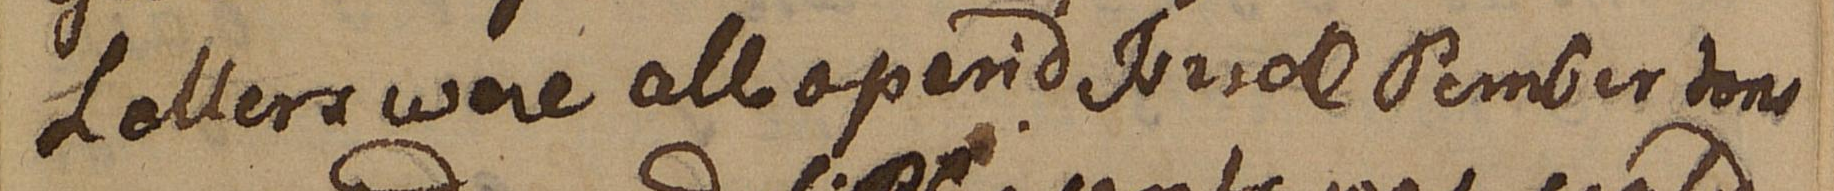Letters were all open'd Isarel Pembertons
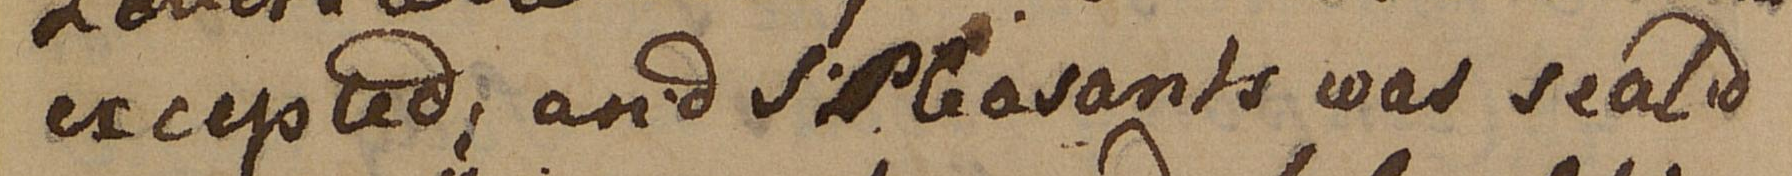excepted; and S Pleasants was seal'd
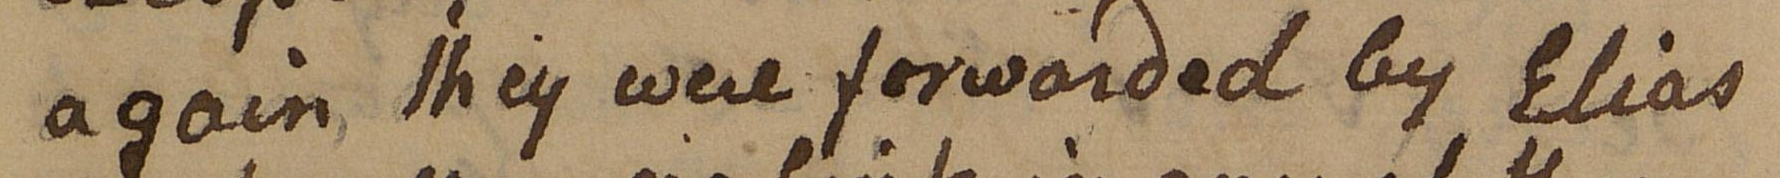again, they were forwarded by Elias
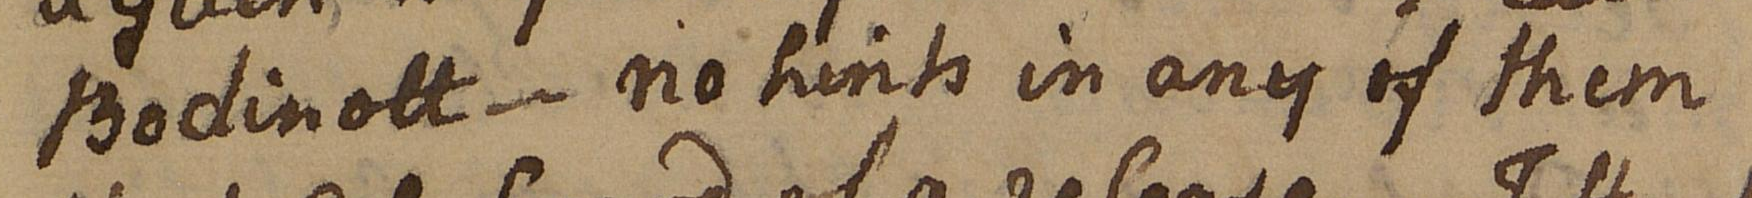Bodinott- no hints in any of them
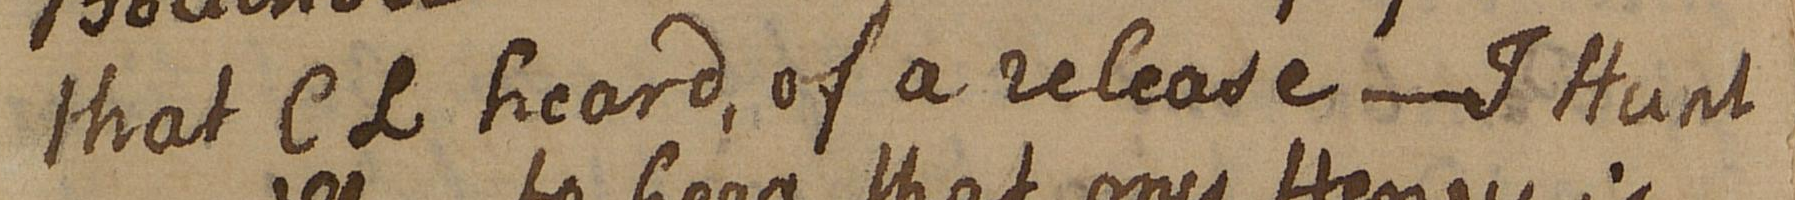that CL heard, of a release- J Hunt
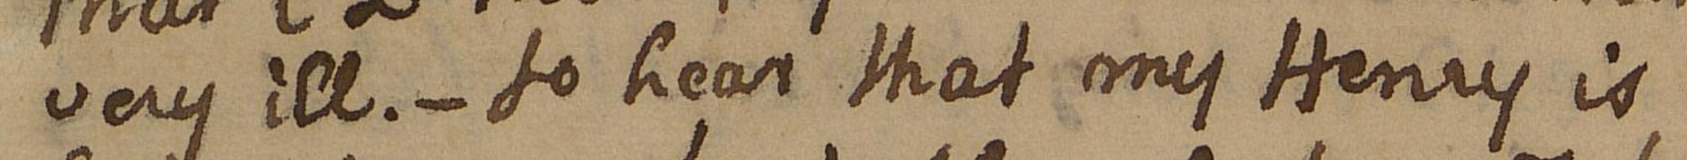very ill.- to hear that my Henry is
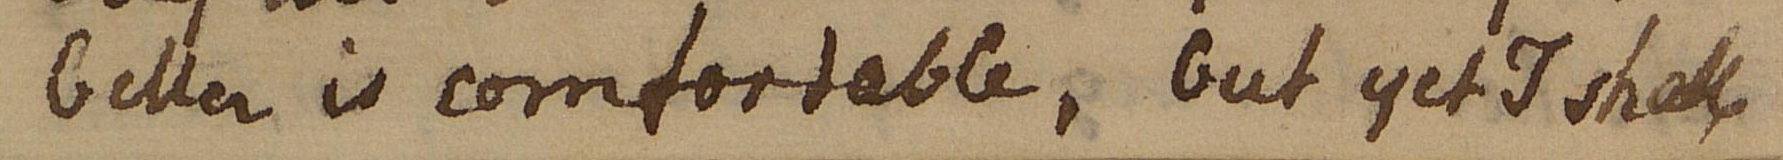better is comfortable, but yet I shall
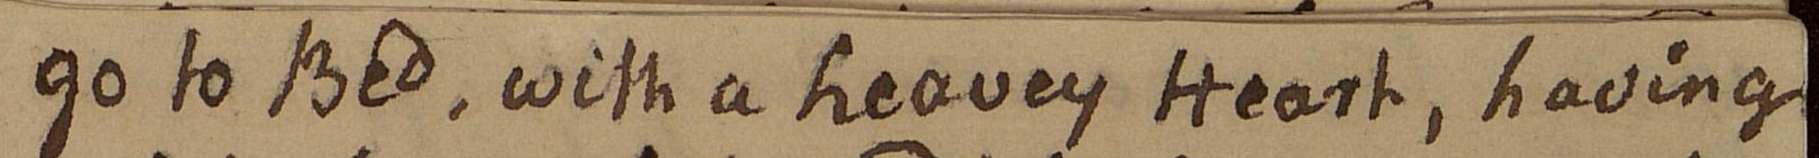go to Bed, with a heavey Heart, having
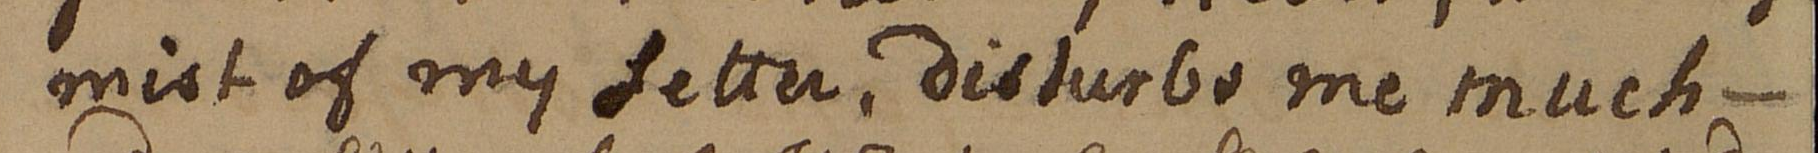mist of my Letter. disturbs me much-
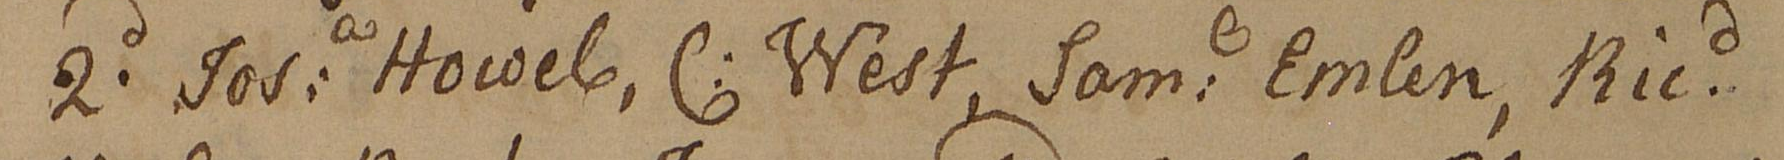2^d. Jos^a: Howel, C: West, Sam^l: Emlen, Ric^d.
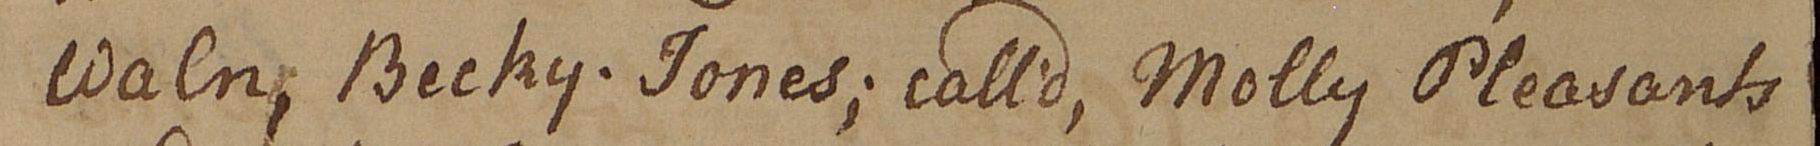Waln, Becky Jones; call'd, Molly Pleasants
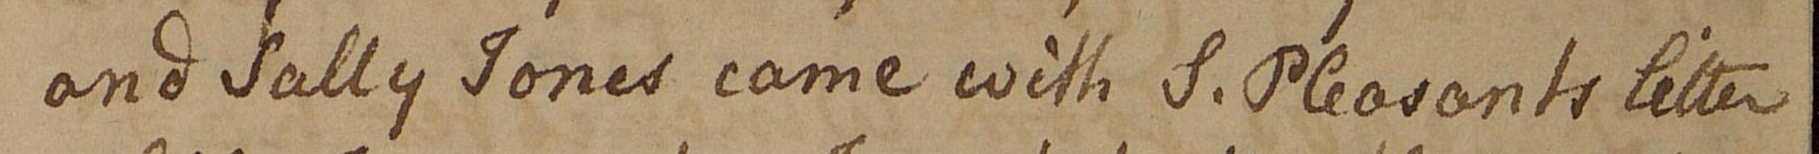and Sally Jones came with S. Pleasants letter
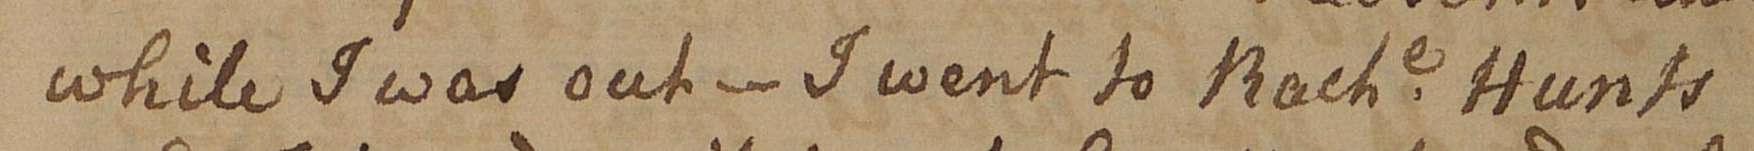while I was out- I went to Rach^l. Hunts
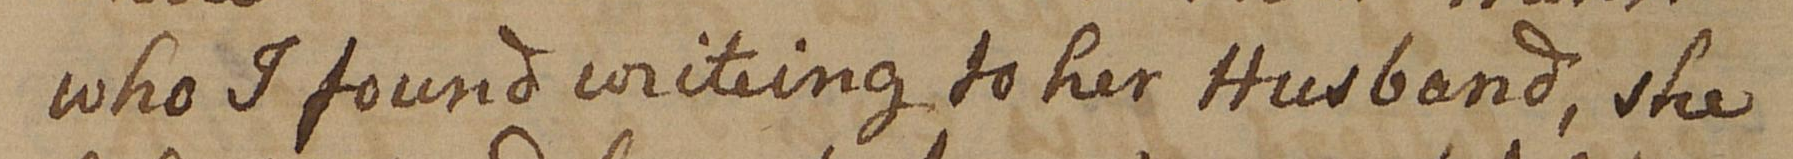who I found writeing to her Husband, she
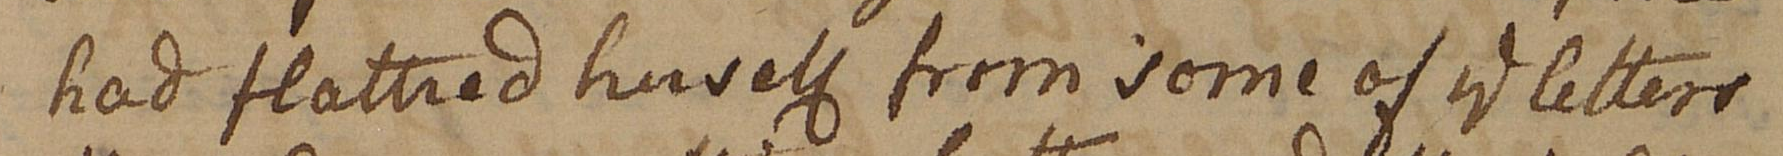had flattred herself from some of y^e letters
